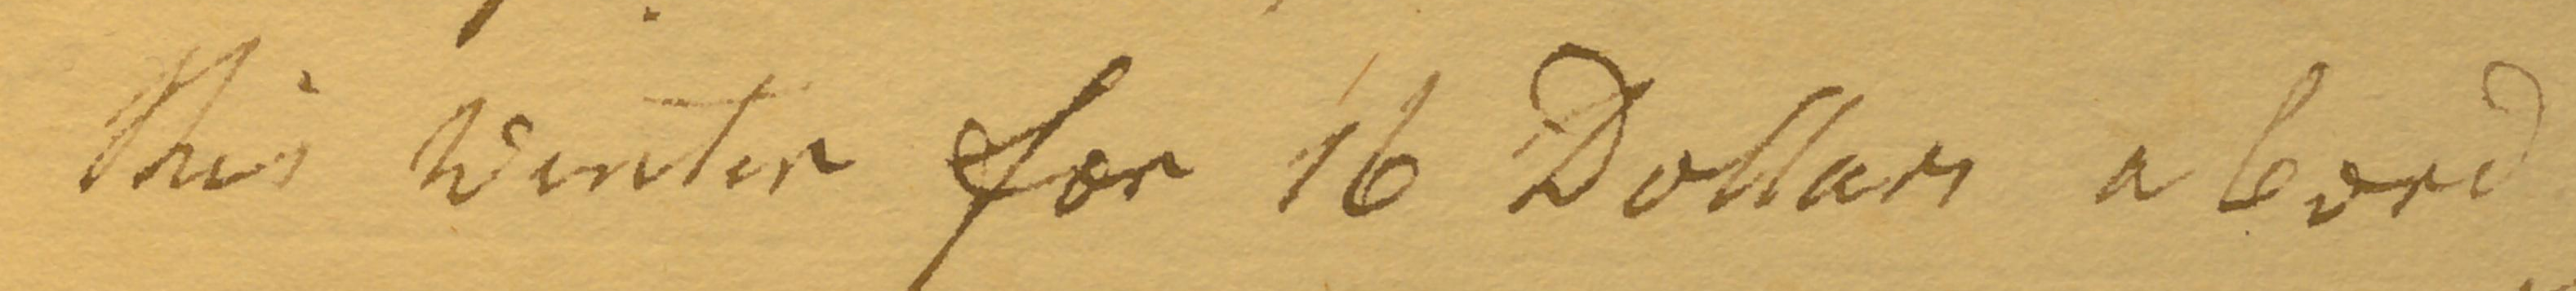this winter for 16 Dollars a Cord
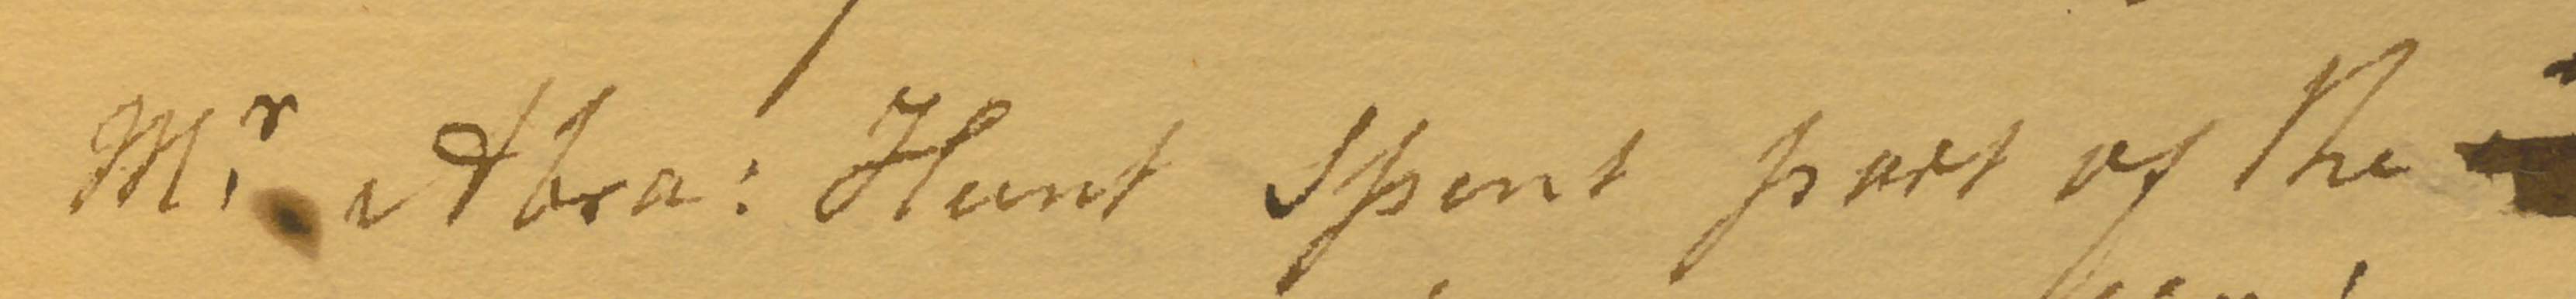M^r. Abra: Hunt spent part of the
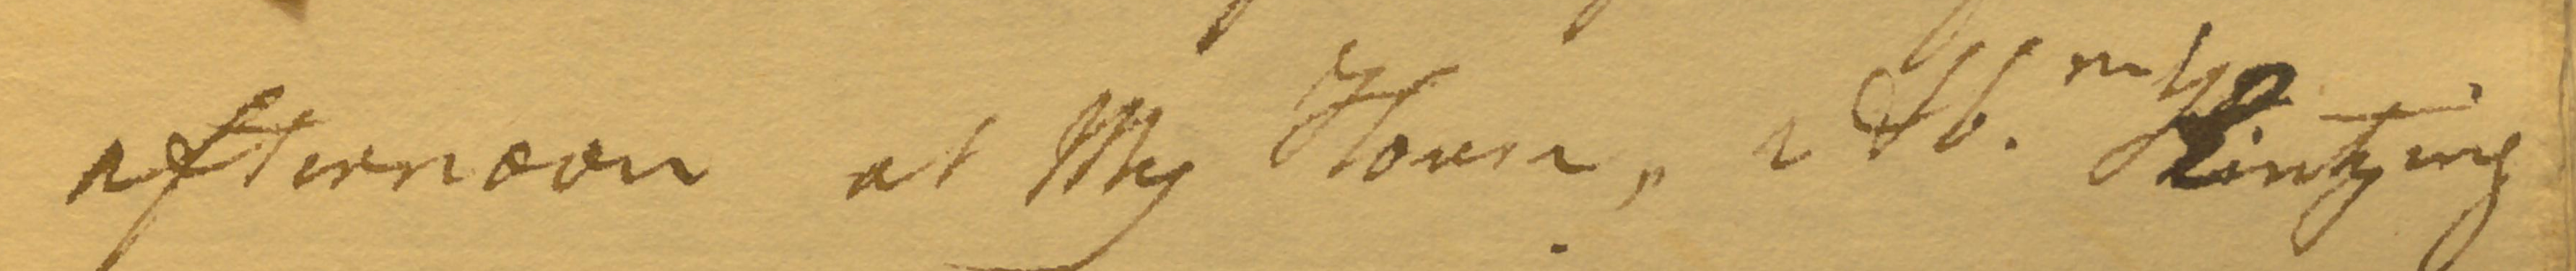afternoon at My House, Ab^m. Kintzing
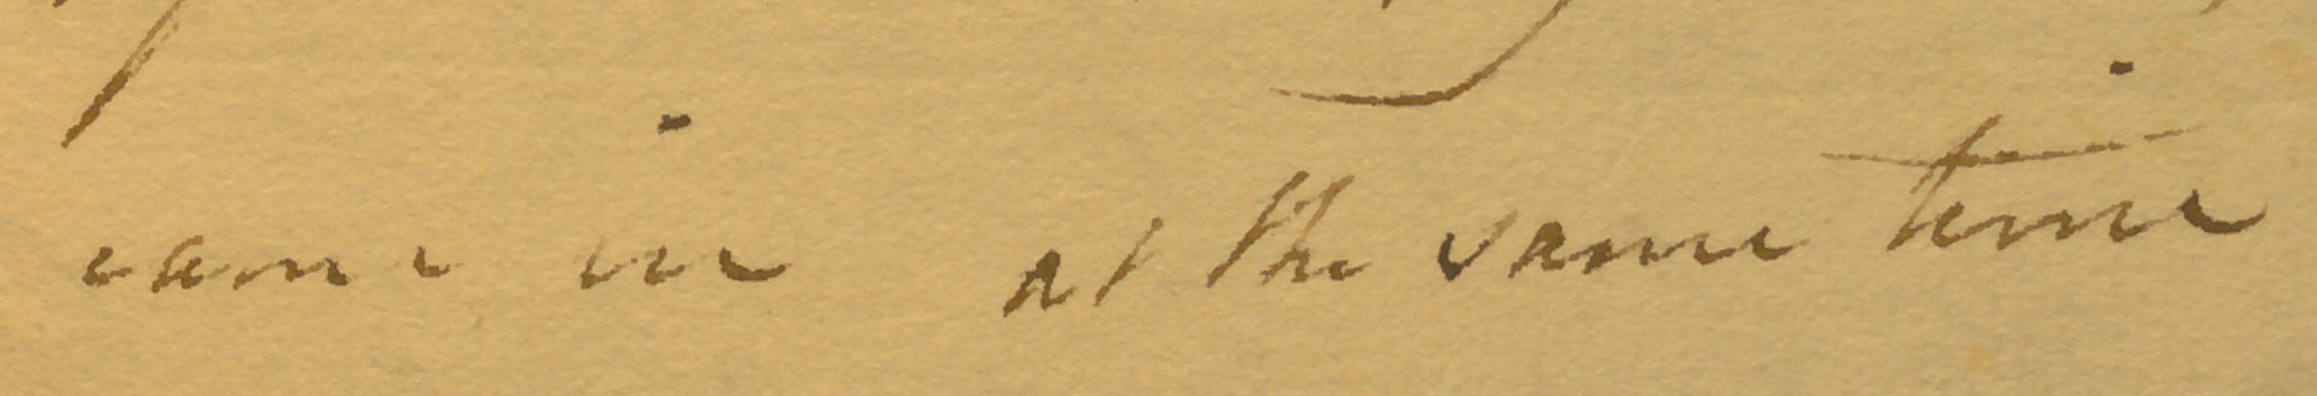came in at the same time
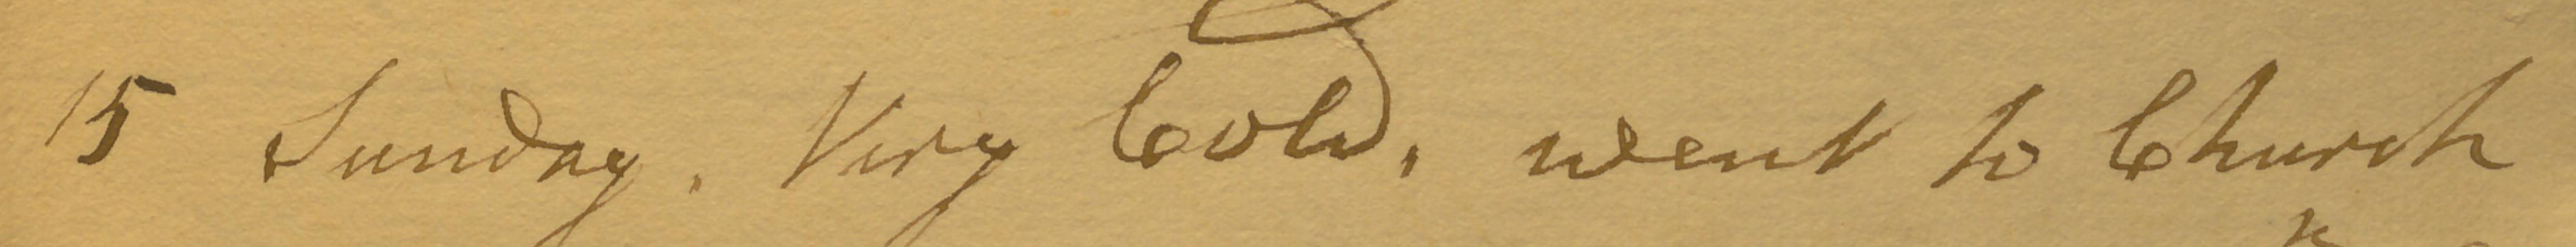15 Sunday Very Cold, went to Church
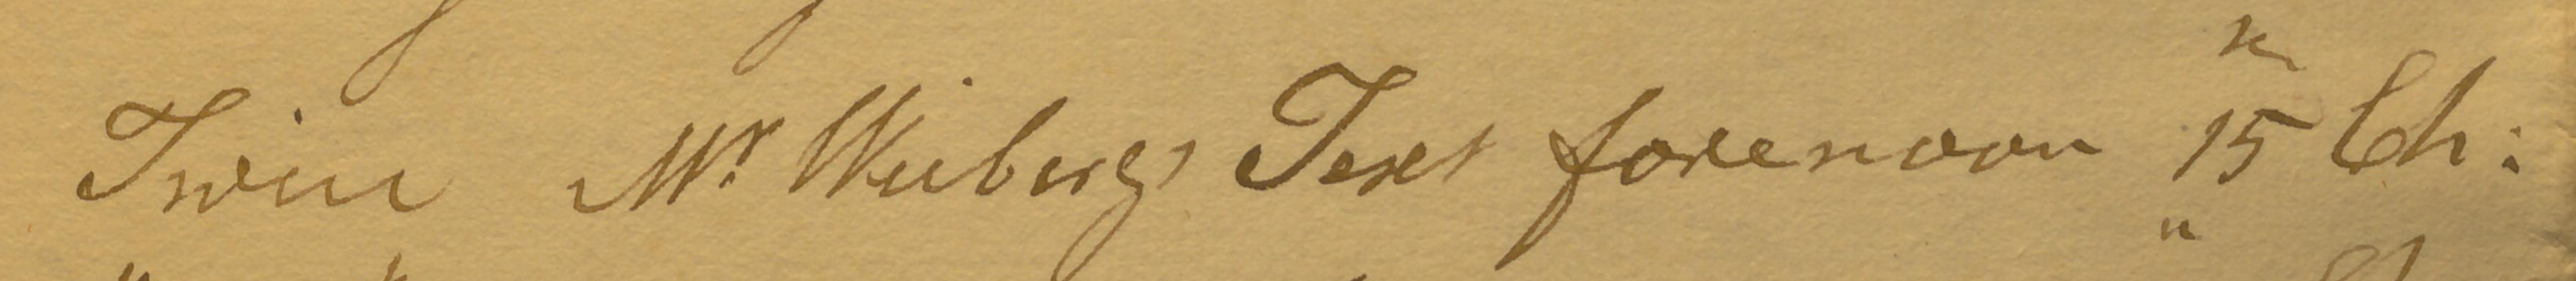Twice M^r. Weibergs Text forenoon 15^th Ch.
